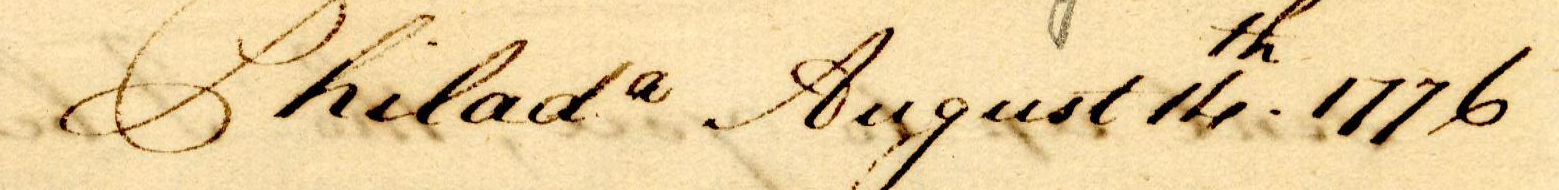Philad^a August 14^th. 1776
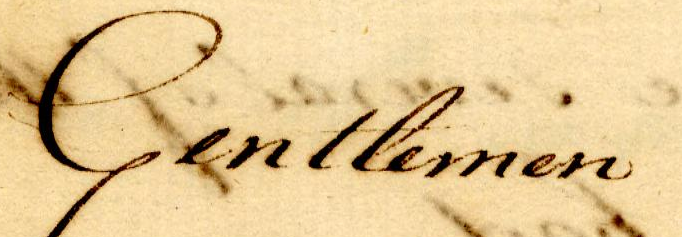Gentlemen
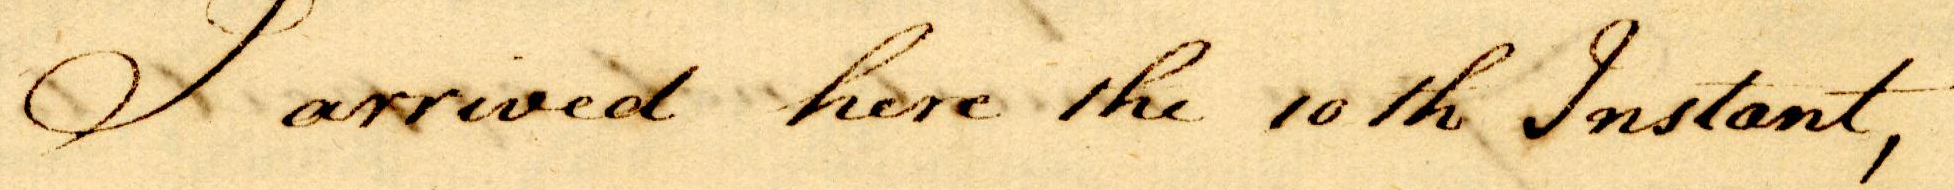I arrived here the 10th Instant,
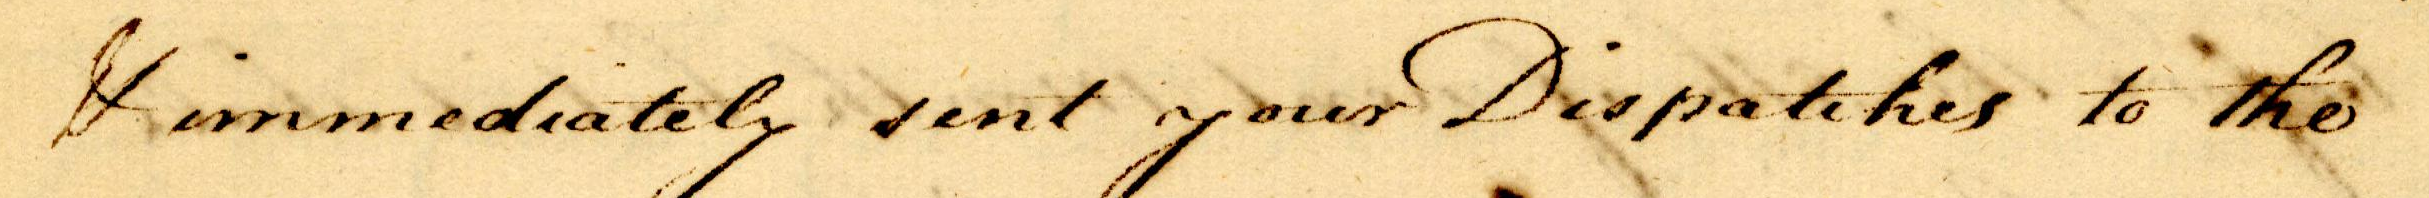& immediately sent your Dispatches to the
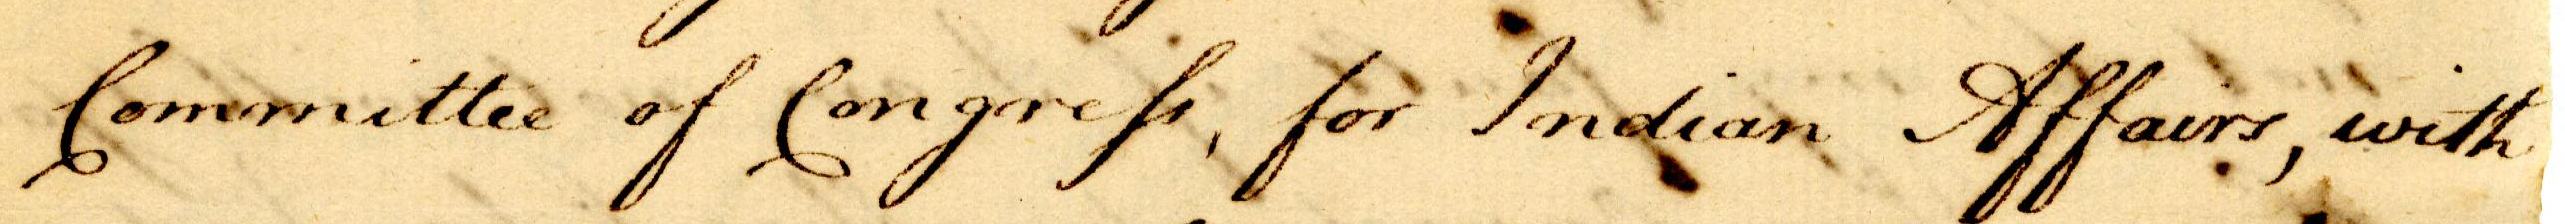Committee of Congress, for Indian Affairs, with
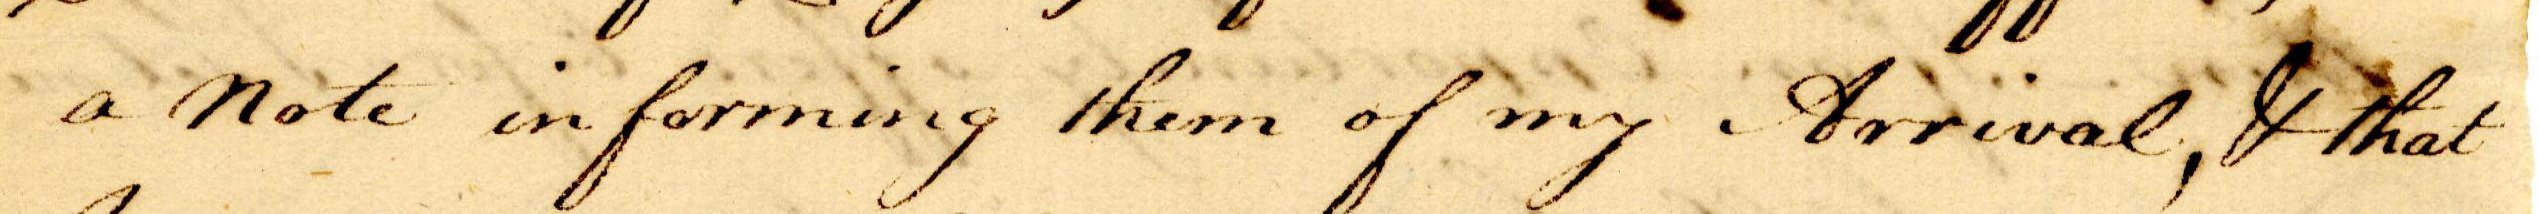a note informing them of my Arrival, & that
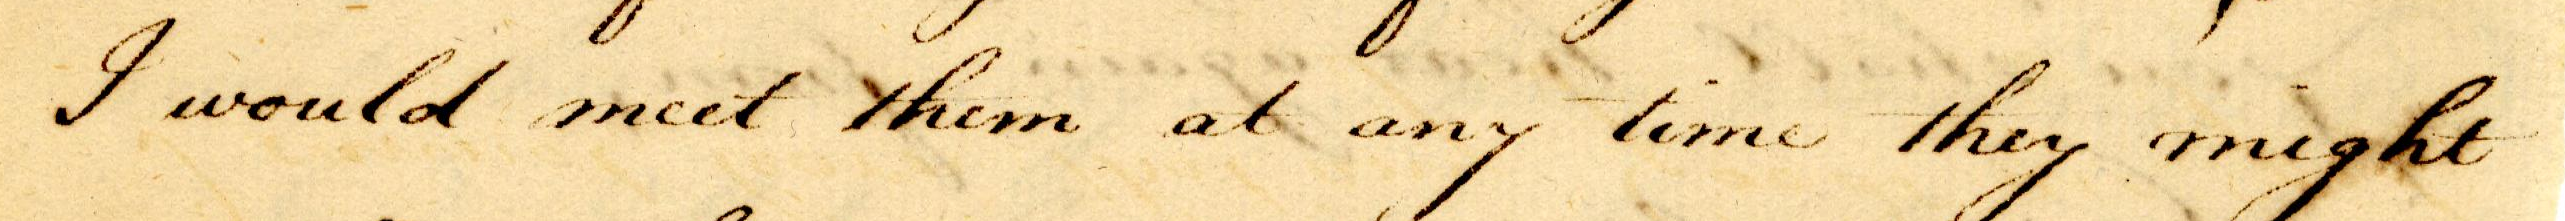I would meet them at any time they might
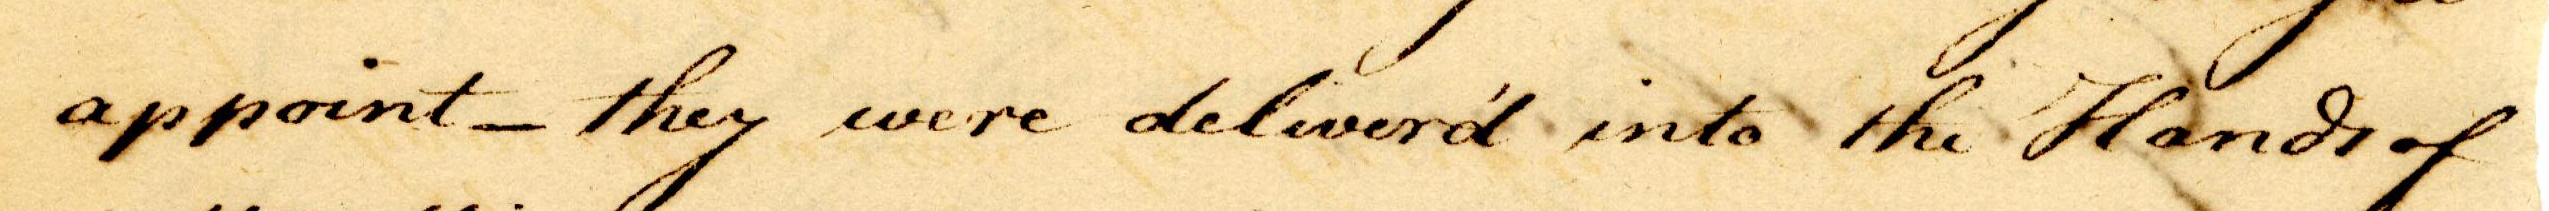appoint- they were deliver'd into the Hands of
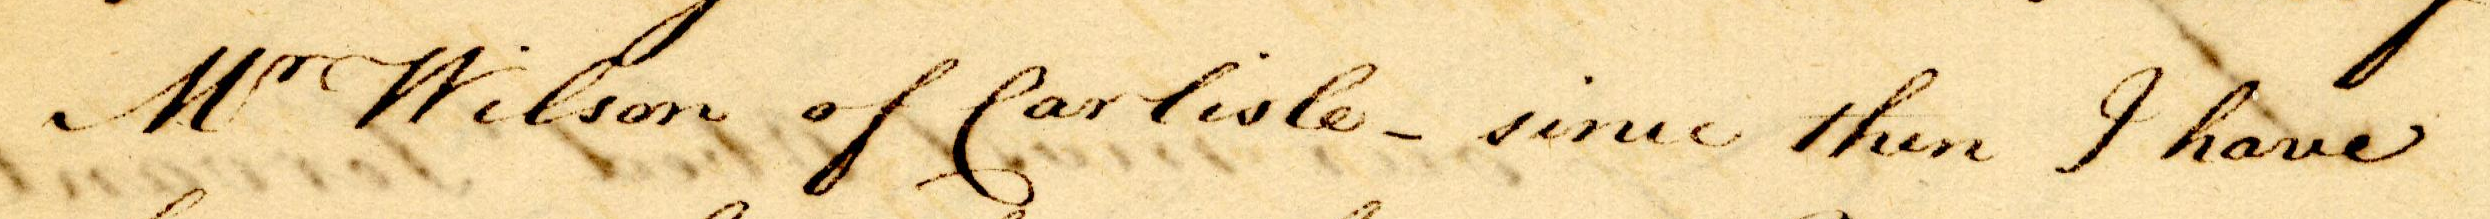M^r Wilson of Carlisle- since then I have
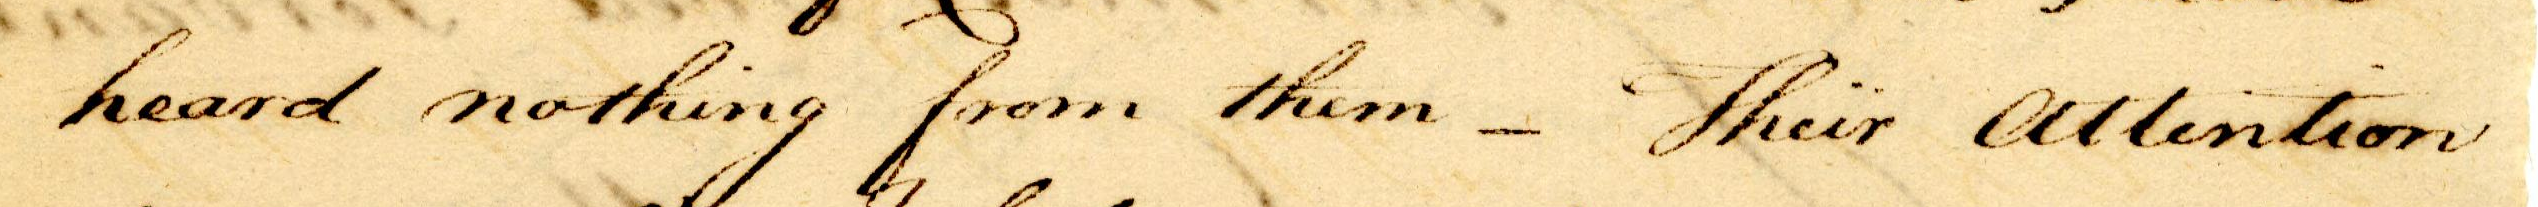heard nothing from them- Their Attention
